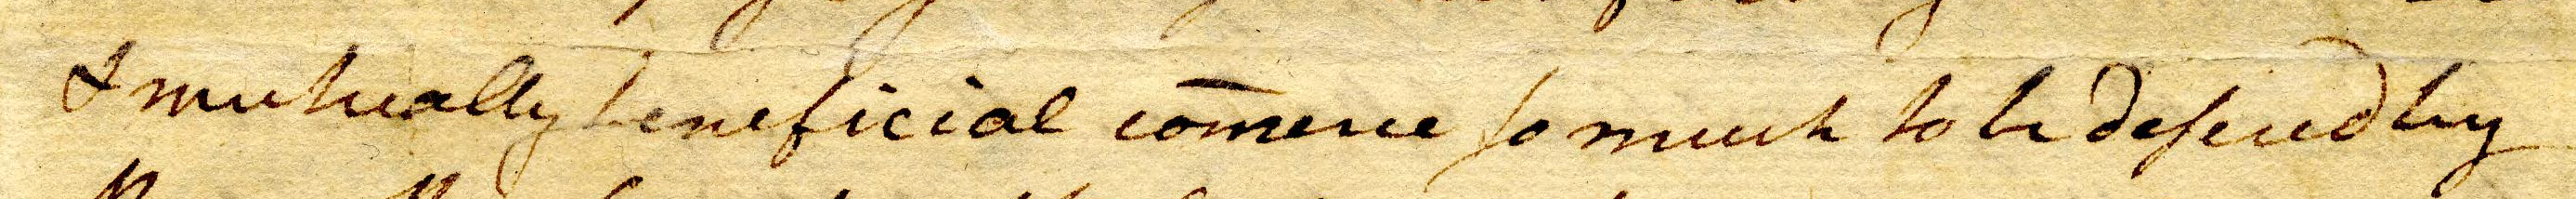& mutually beneficial comerce so much to be defered by
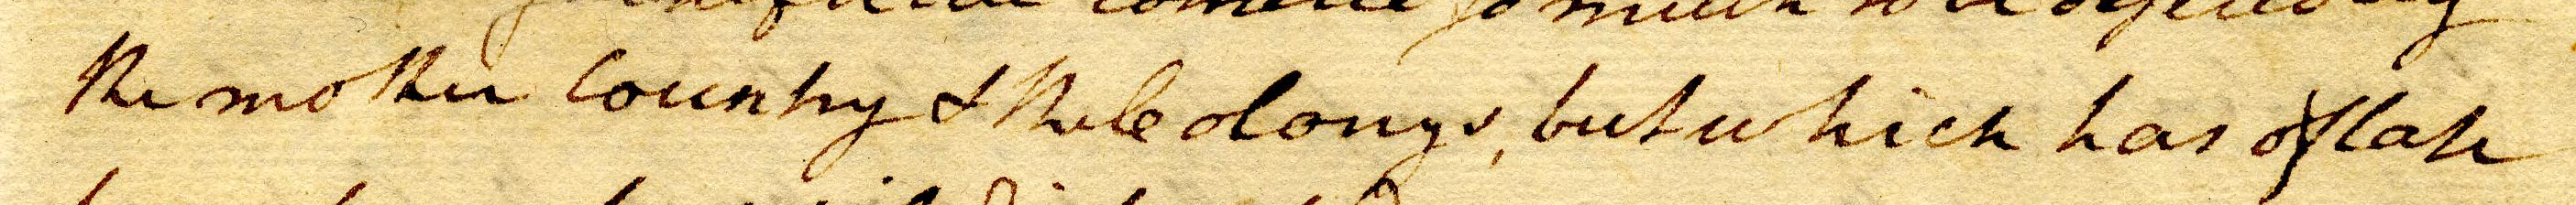the mother Country & these Colonys, but which has of late
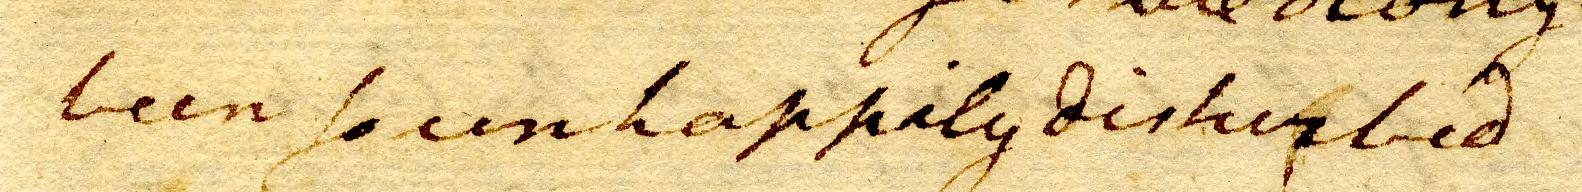been so unnhappily disturbed
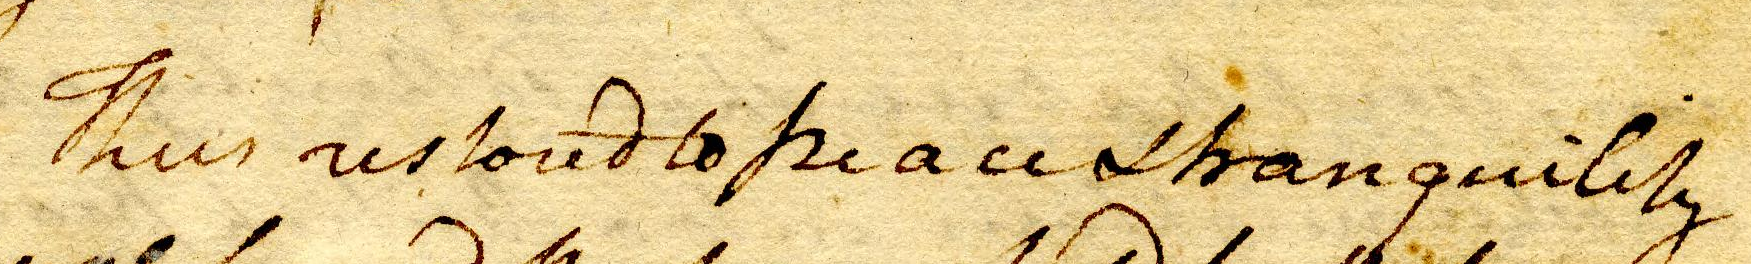This restored to peace & tranquility
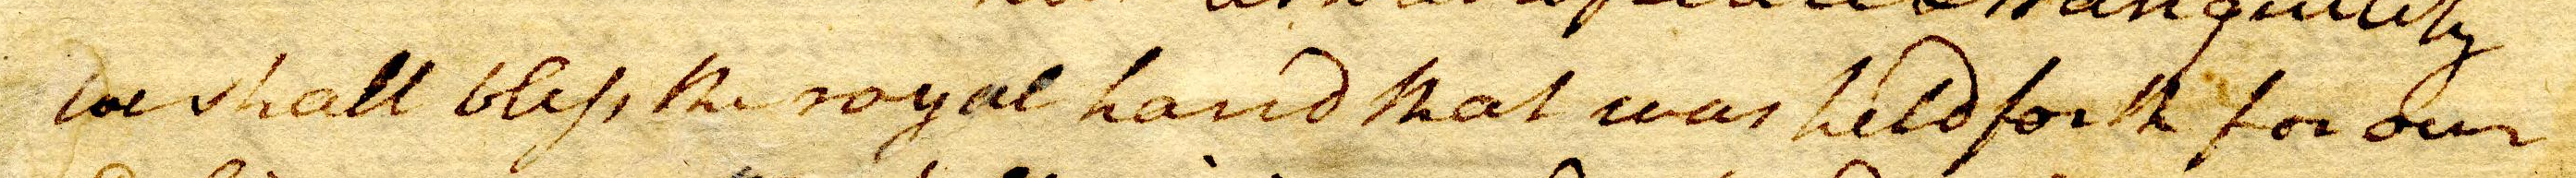we shall bless the royal hand that was held forth for our
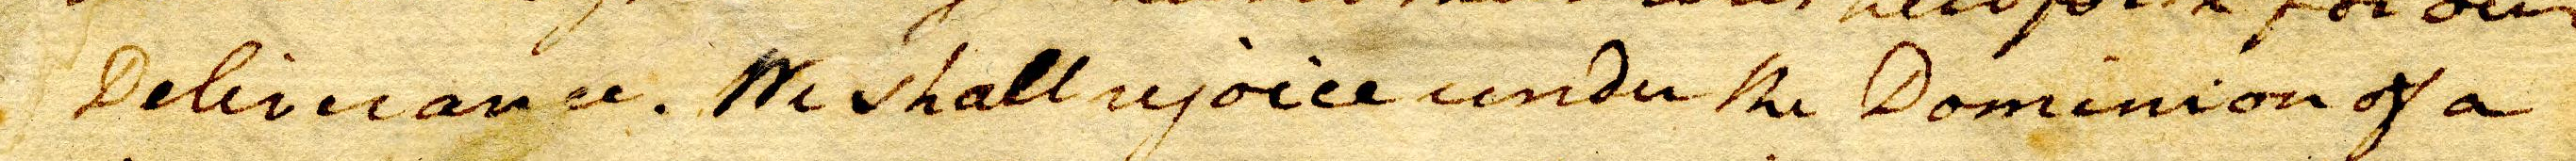Deliverance. We shall rejoice under the Dominion of a
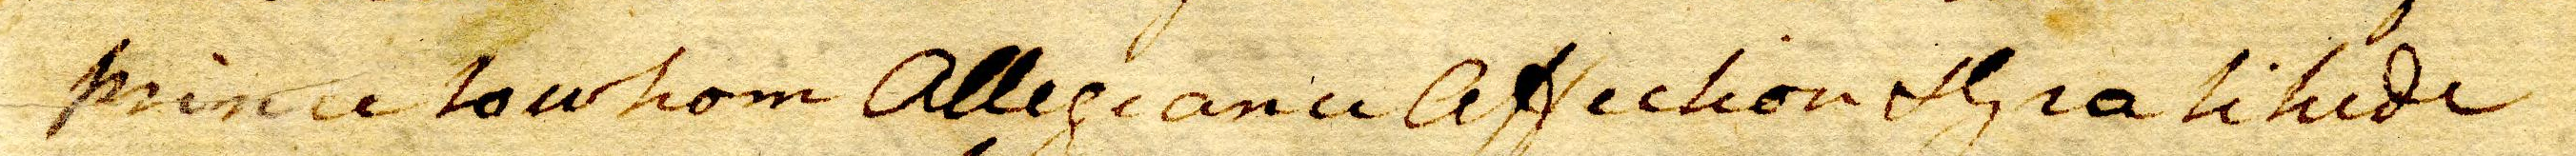prince to whom Allegiance Affection & gratitude
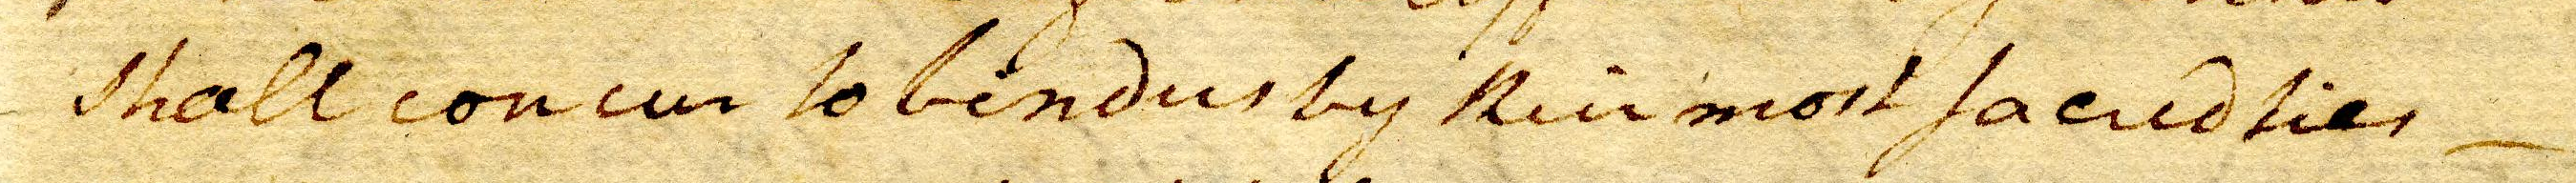shall concur to bind us by their most sacred lies
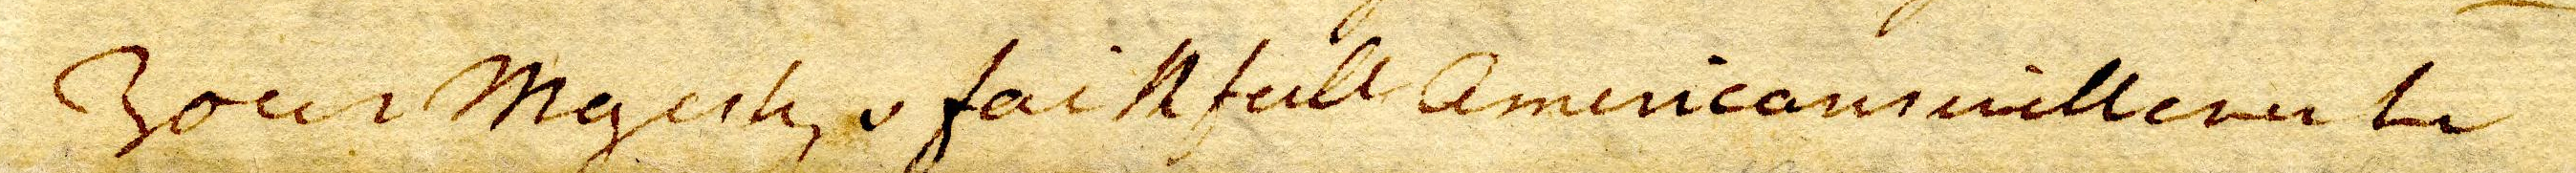Your Majestys faithful Americans will ever be
